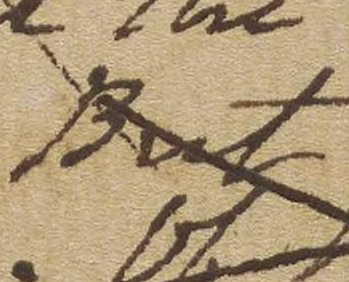But
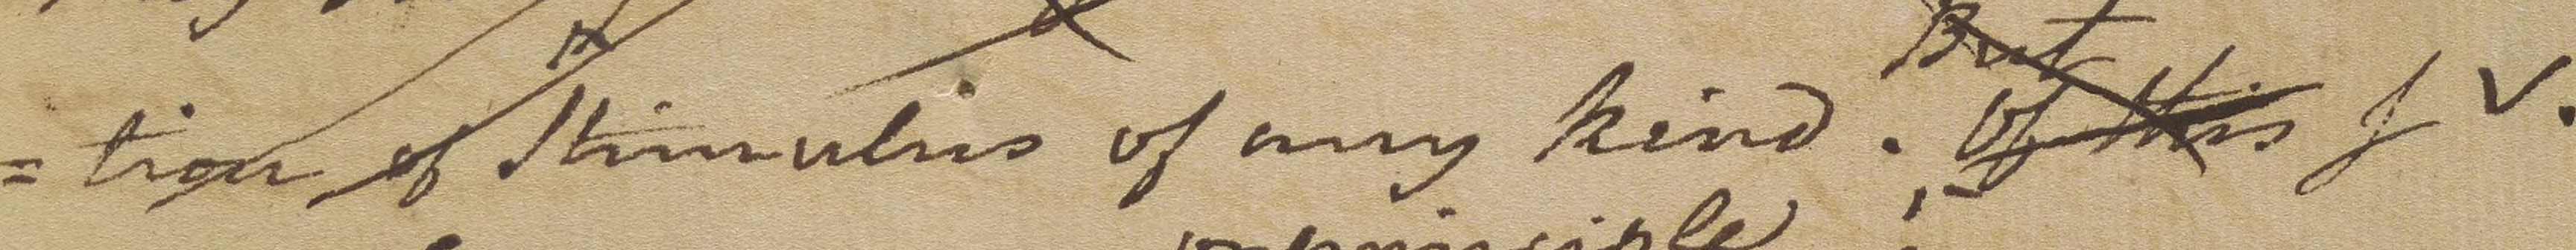-tion of Stimulus of any kind. [Of this] I V.
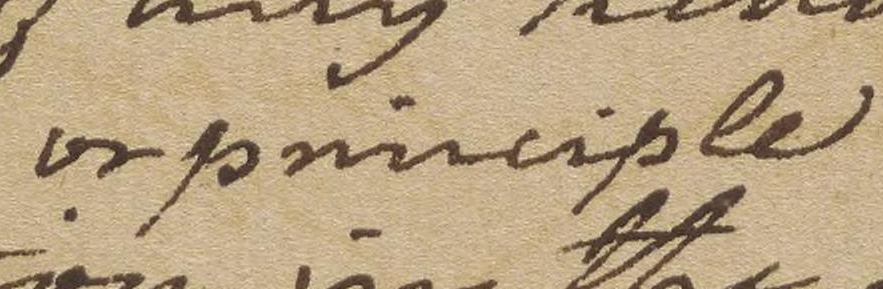or principle
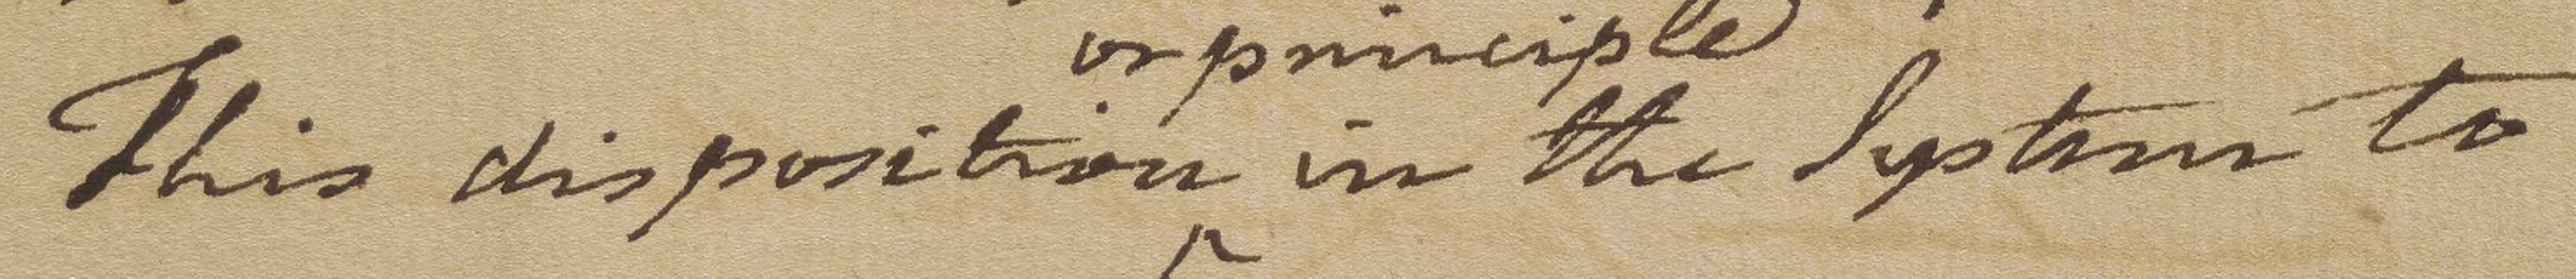This disposition ^ in the System to
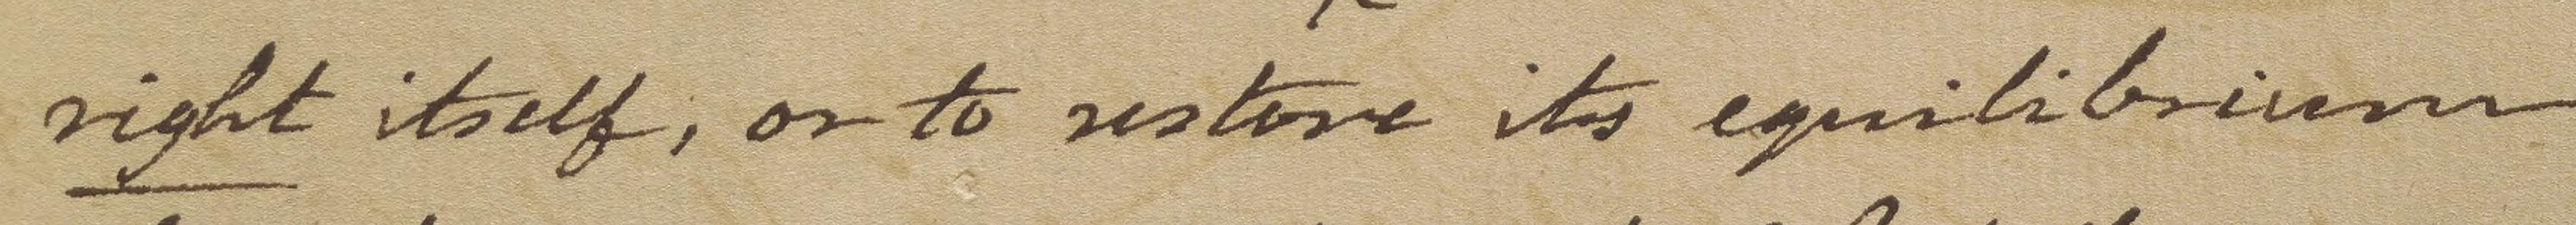right itself, or to restore its equilibrium
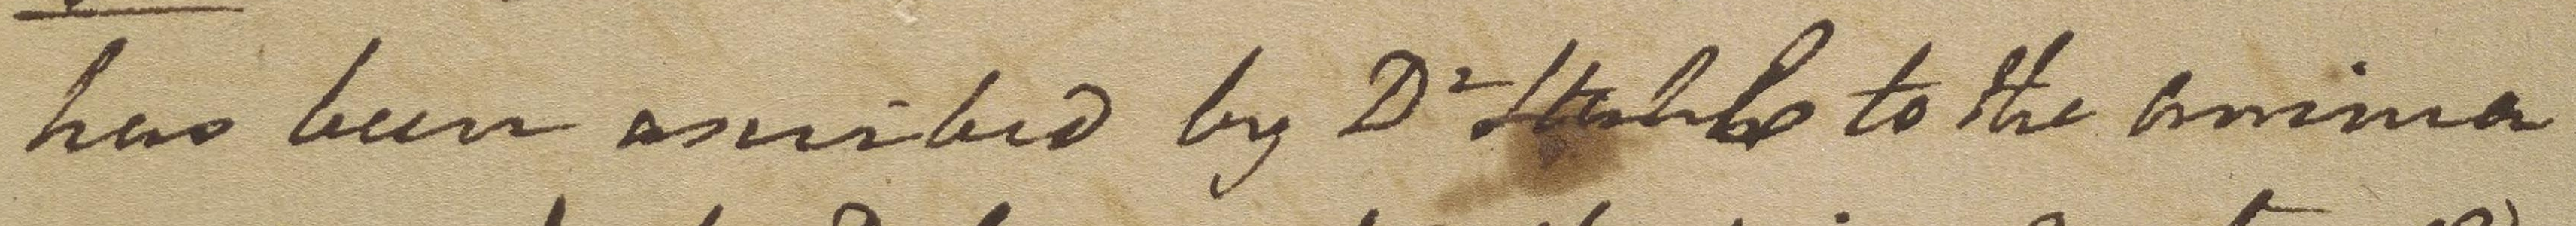has been ascribed by D^r Stubbs to the anima
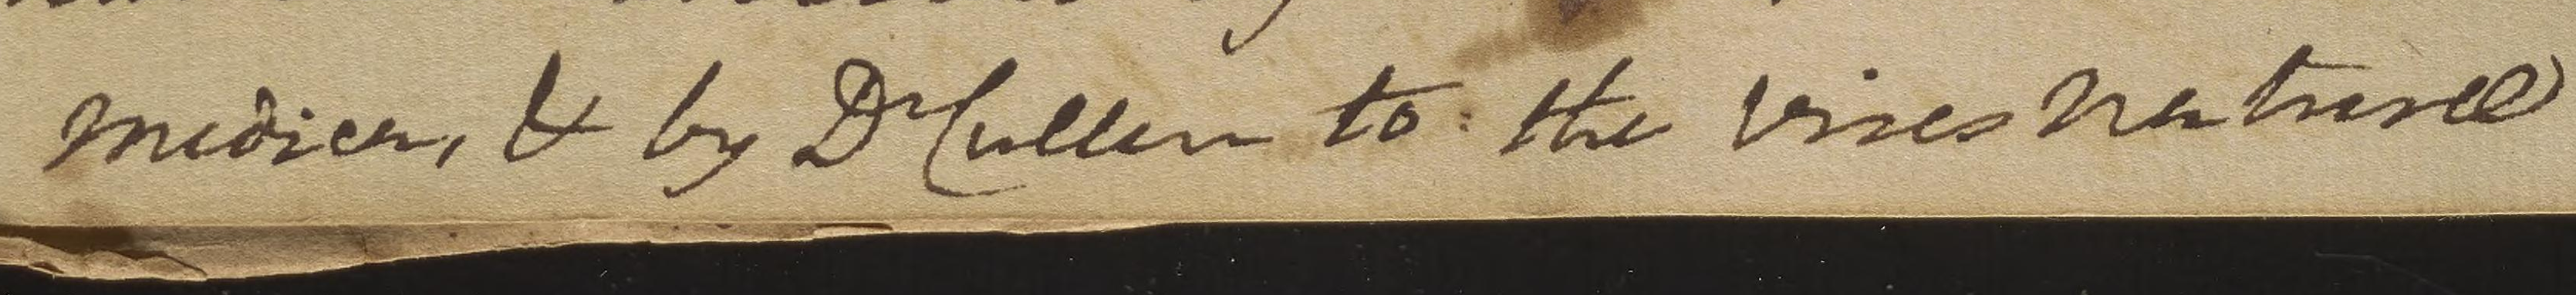medica, & by D^r Cullen to the vises naturae
